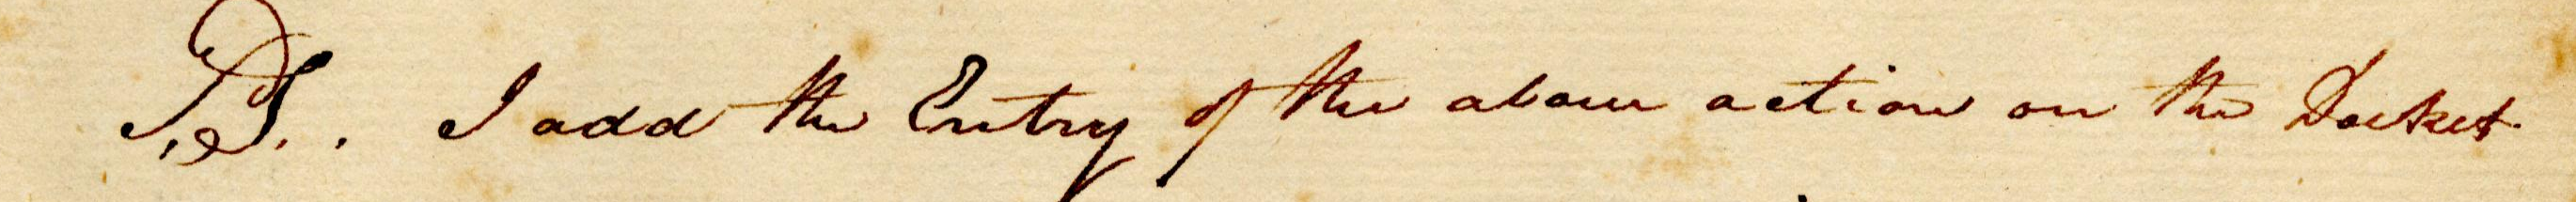P.S. I add the Entry of the above action on the Docket
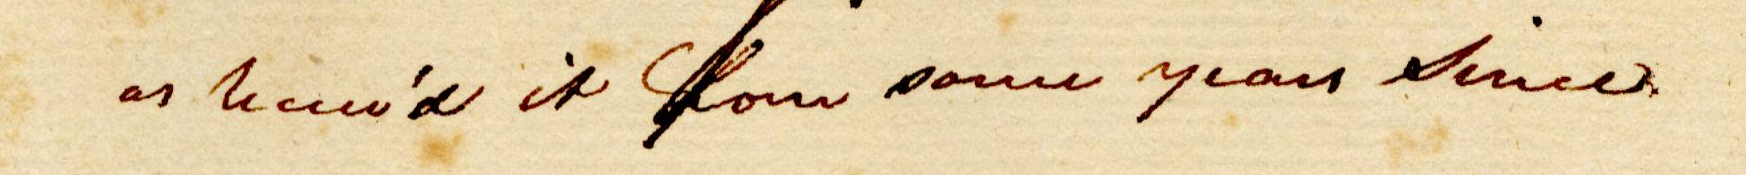as recev'd it from some years since
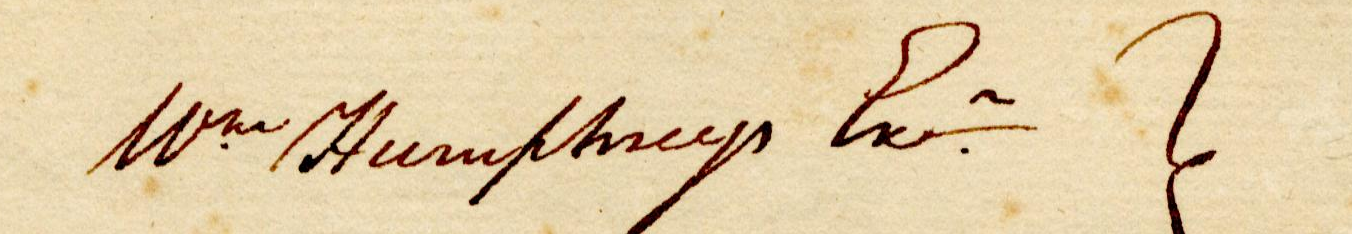W^m. Humpheys Ex^r.
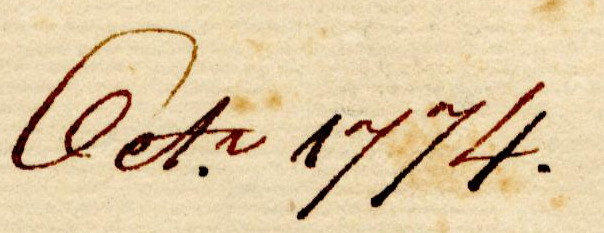Oct^r 1774
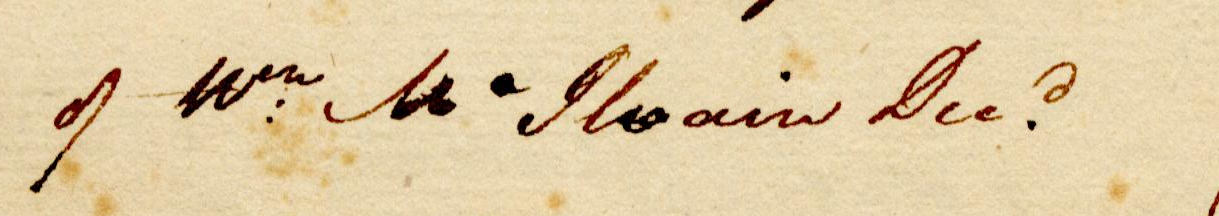of W^m. M^cIlvain Dec^d.
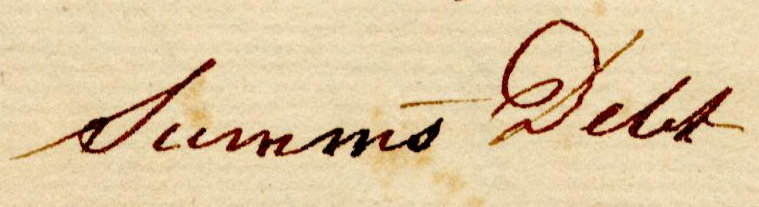Summs Debt
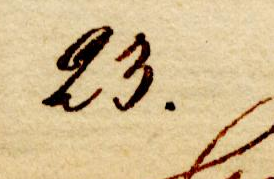23.
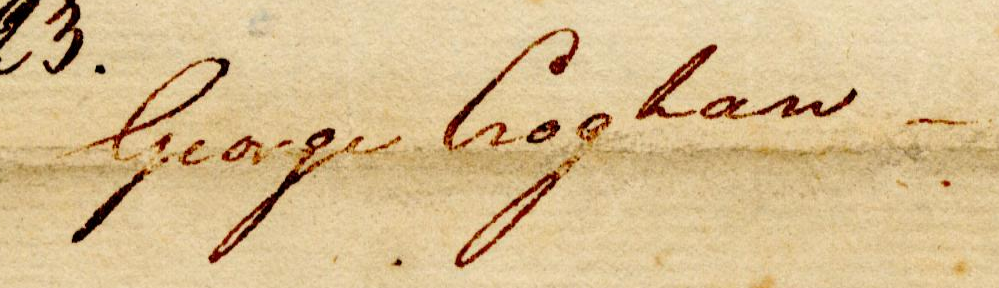George Croghan
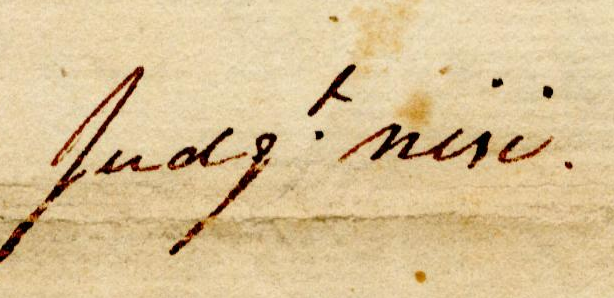Judg^t. nisi.
